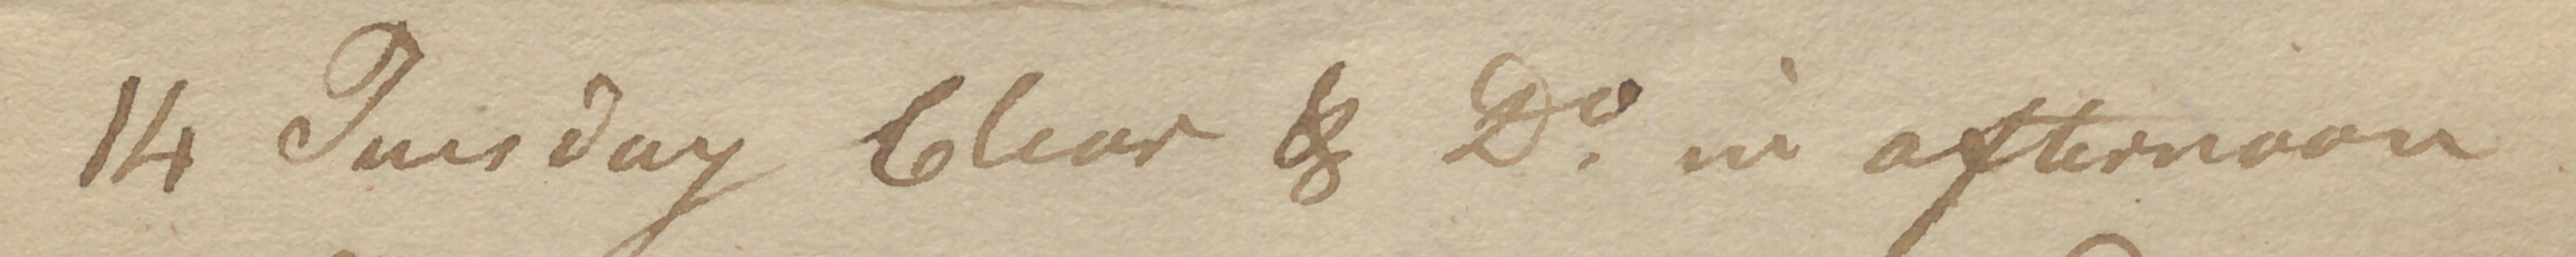14 Tuesday Clear & D^o. in afternoon
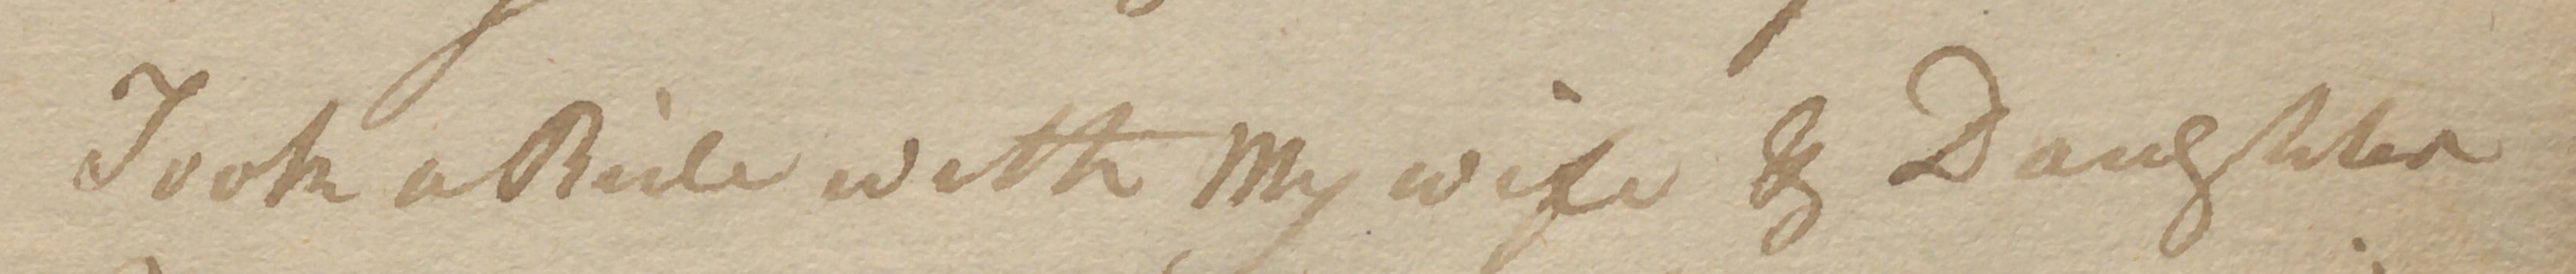Took a Ricle with My wife & Daughter
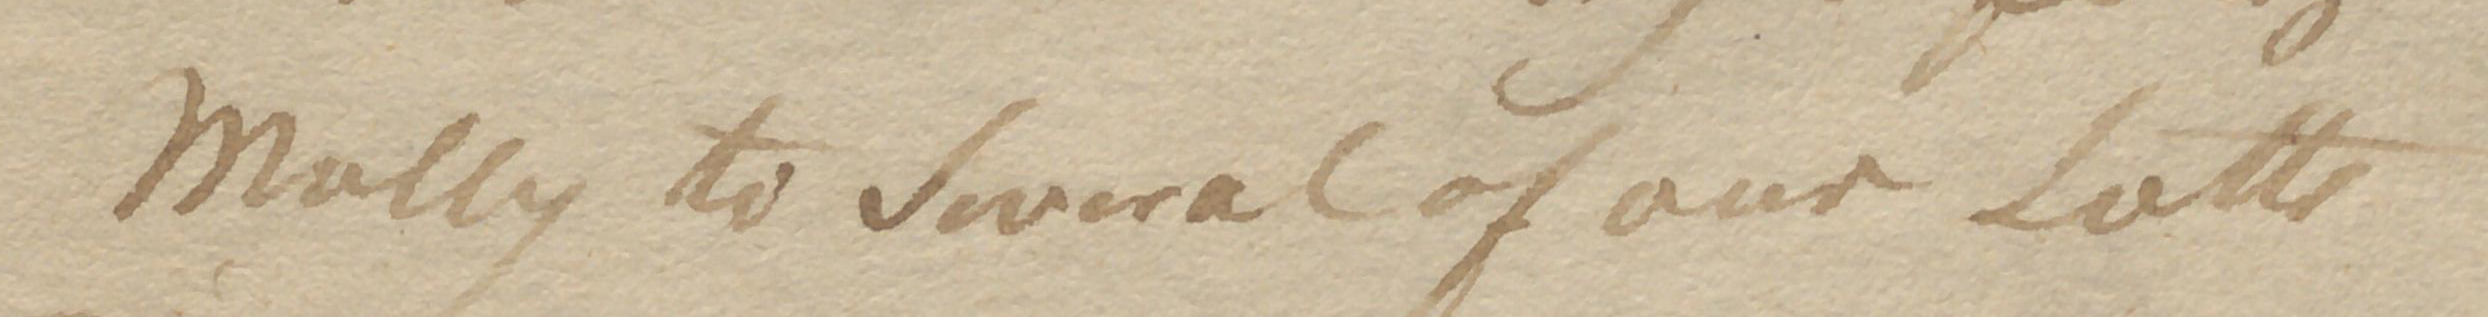Mally to several of our Lotts
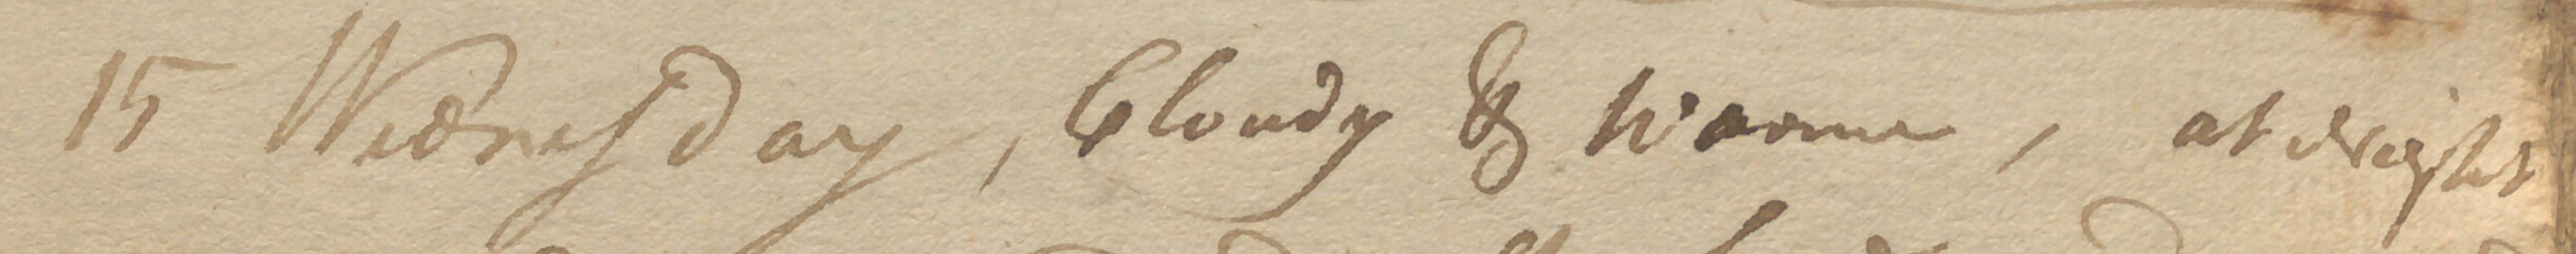15 Wedresday, Cloudy & warme, at Night
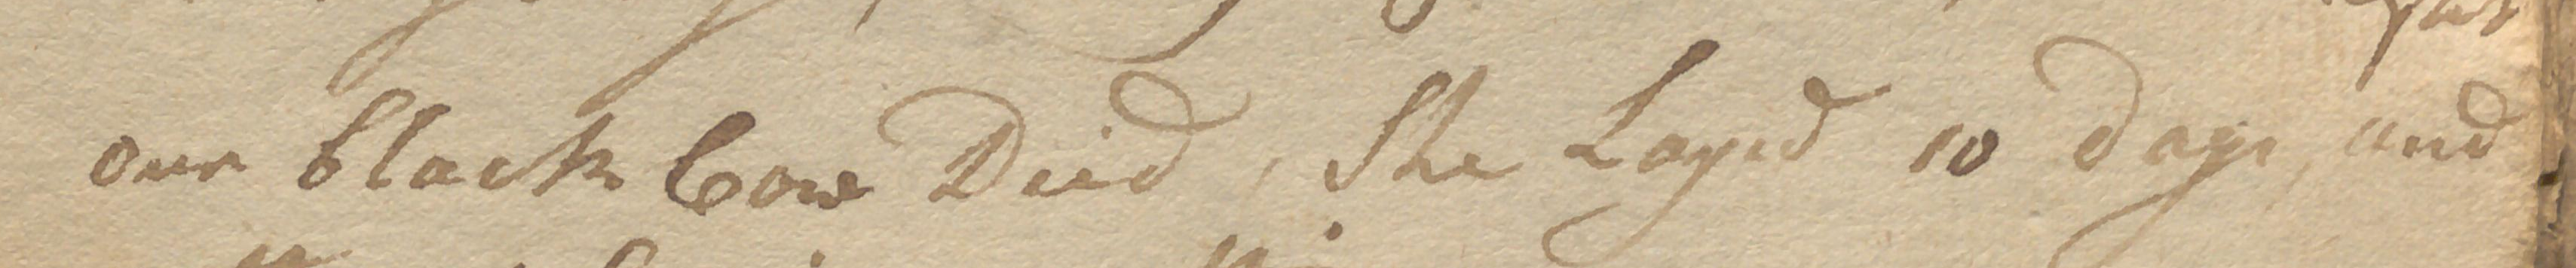our Clack Cow Died. The Layed 10 days and
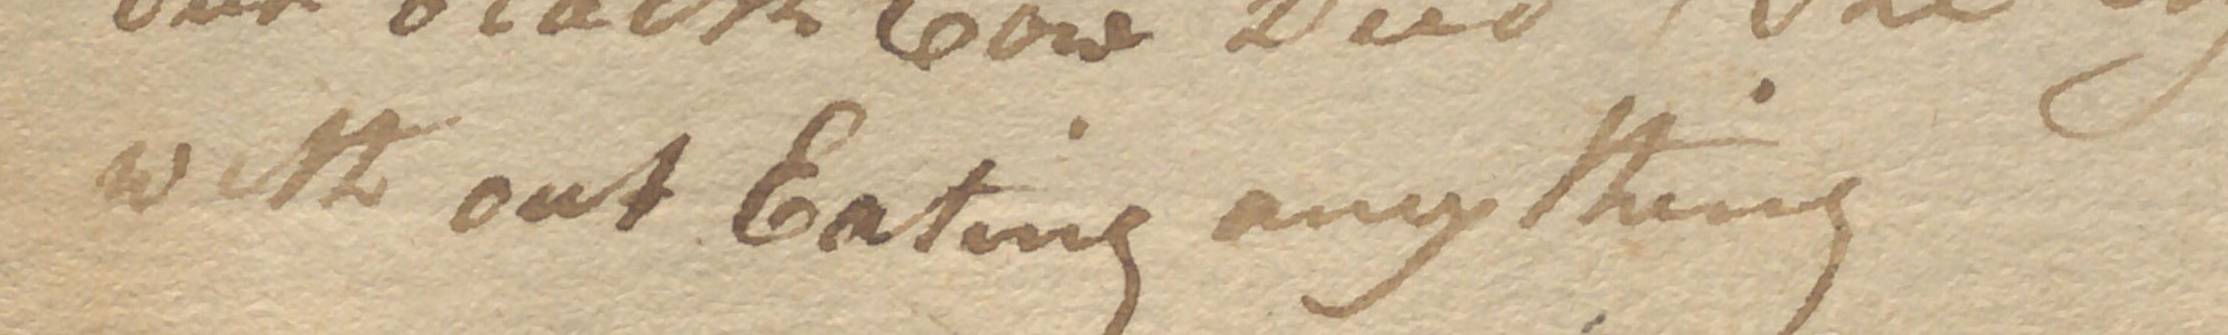with out Eating any thing
